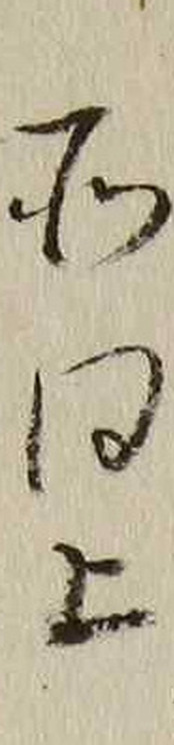所同上
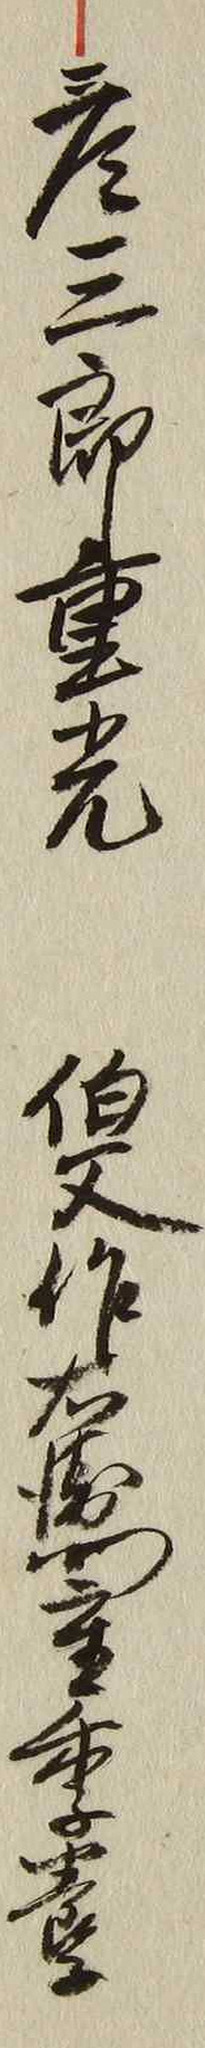彦三郎重光伯父作右衛門重季養子
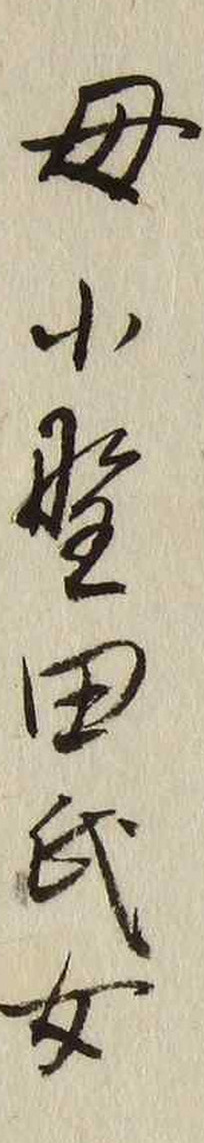母小野田氏女

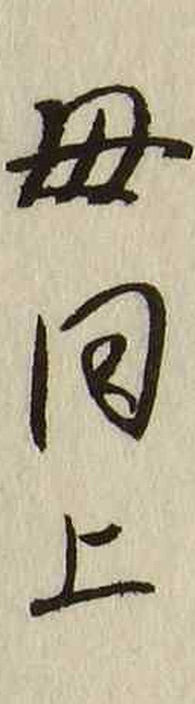母同上
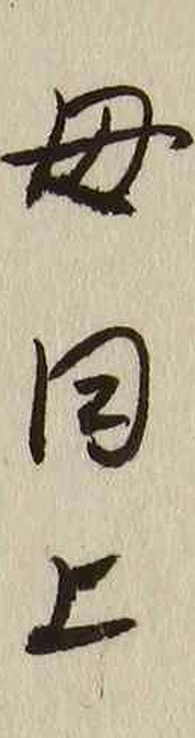母同上
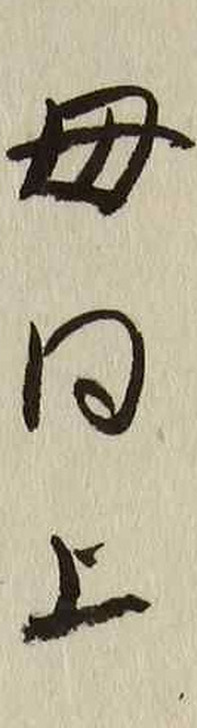母同上
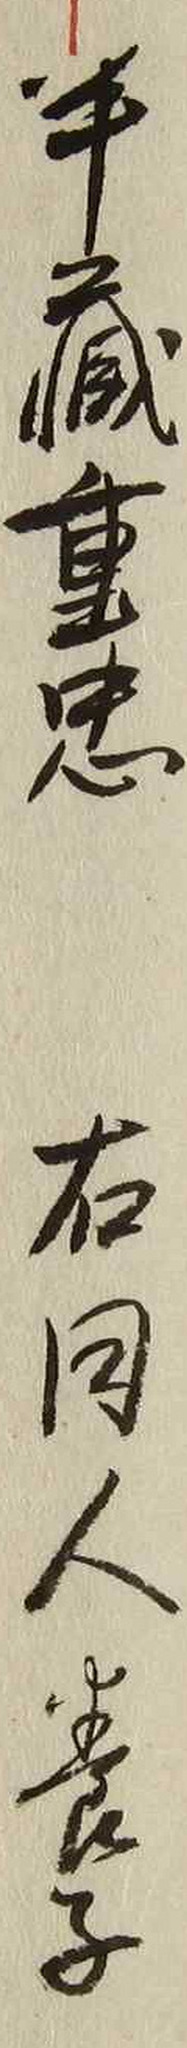半蔵重忠右同人養子
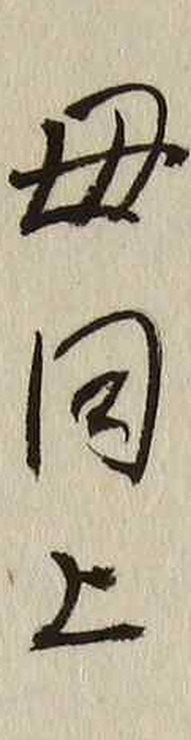母同上
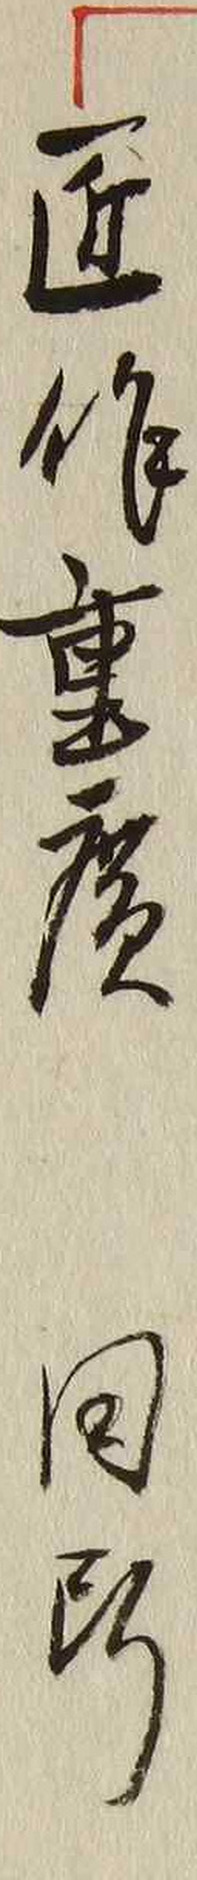匠作重広同断
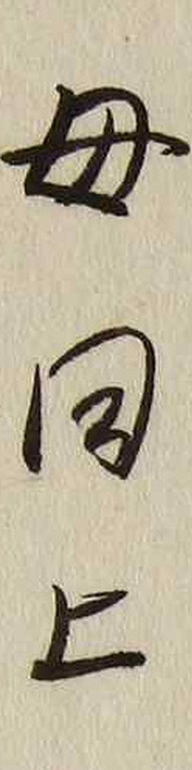母同上

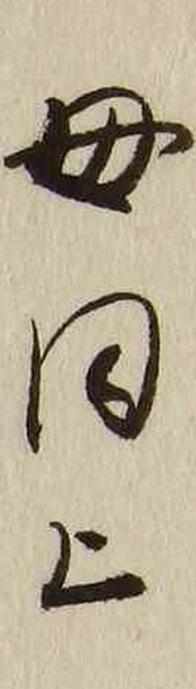母同上
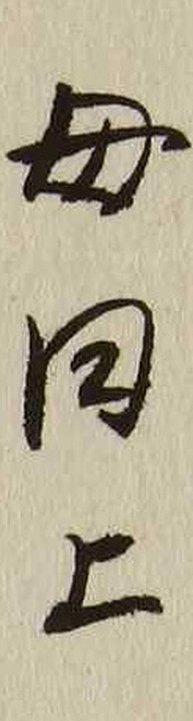母同上
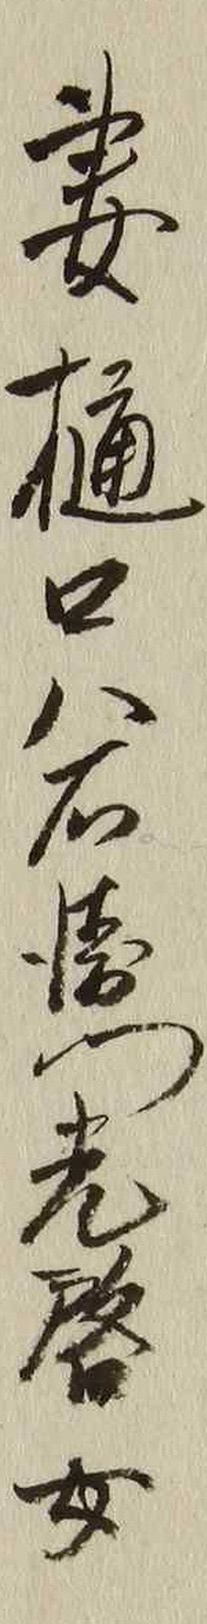妻樋口八右衛門光啓女
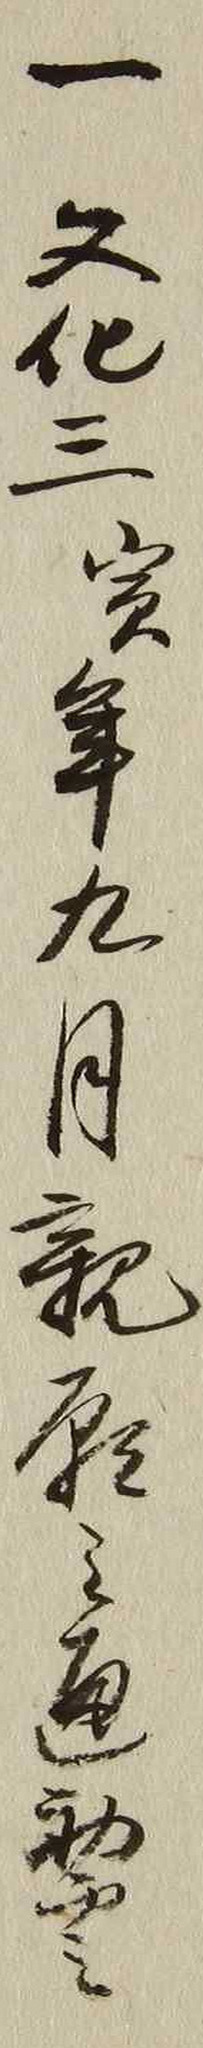一文化三寅年九月親願之通初而之
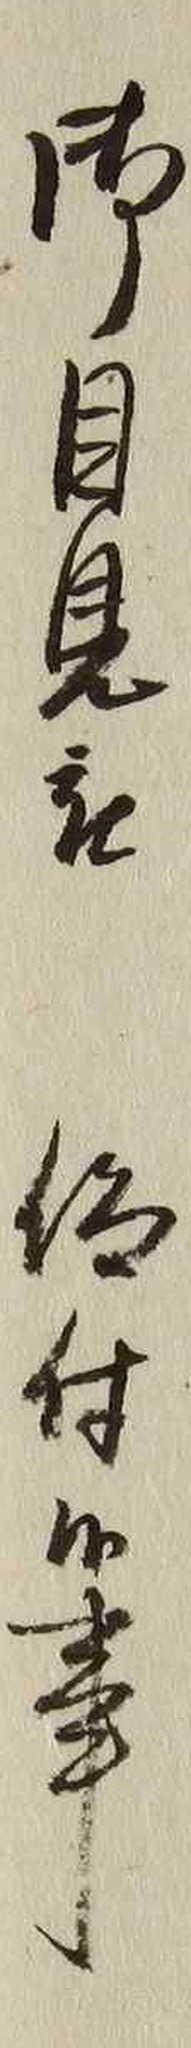御目見被仰付候事
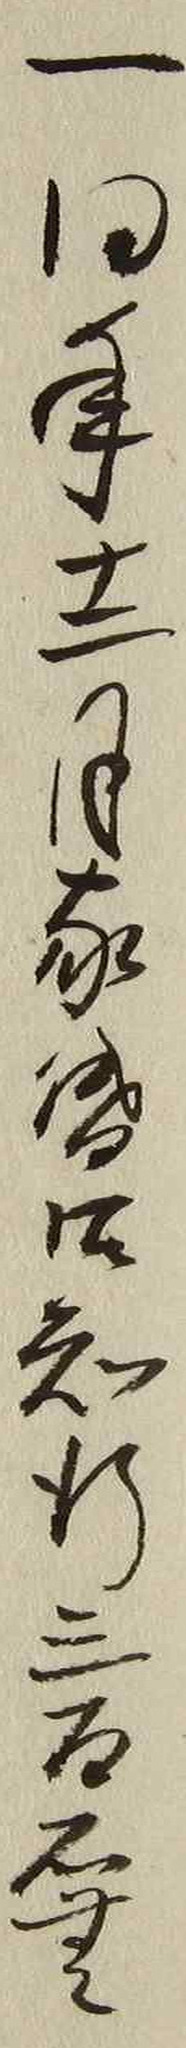一同年十二月家督御知行三百石無
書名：諸士系譜　巻之356　す之部6
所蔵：会津若松市立会津図書館
